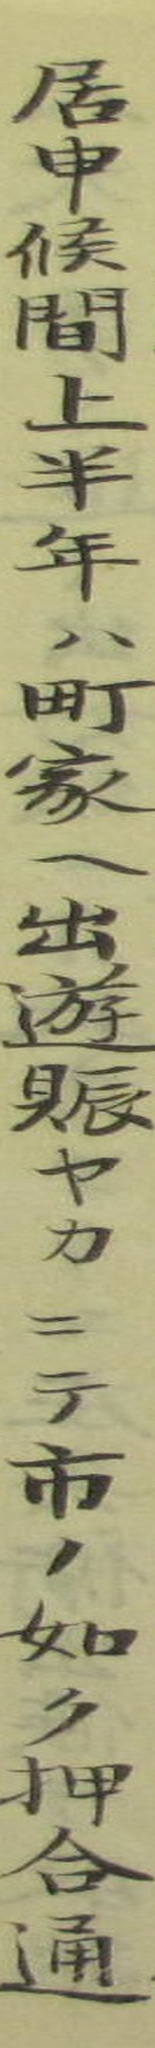居申候間上半年ハ町家へ出遊賑ヤカニテ市ノ如ク押合通
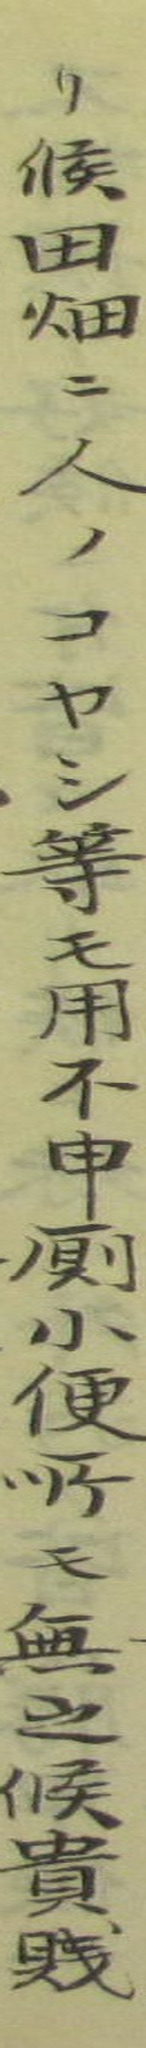リ候田畑ニ人ノコヤシ等モ用不申厠小便所モ無之候貴賤
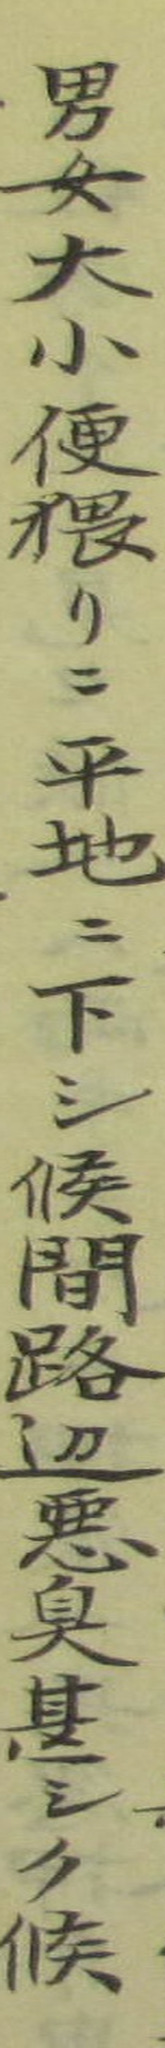男女大小便猥リニ平地ニ下シ候間路辺悪臭甚シク候
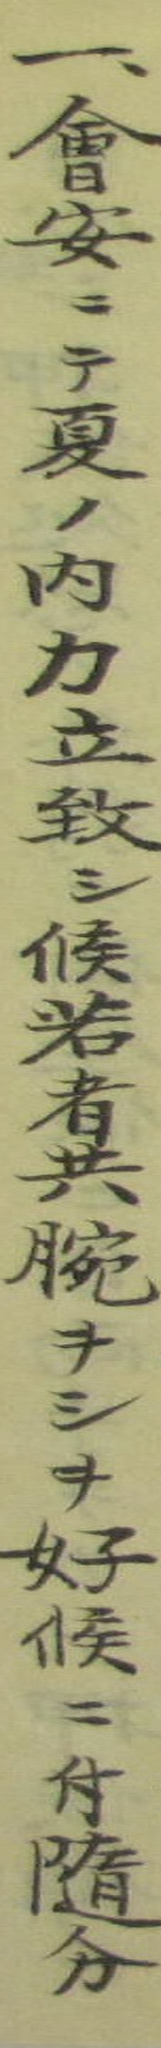一會安ニテ夏ノ内力立致シ候若者共腕ヲシヲ好候ニ付随分

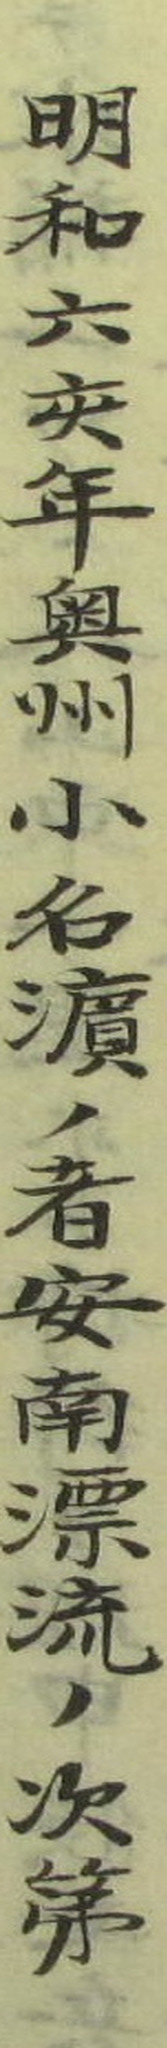盟和六亥年奥州小名濵ノ者安南漂流ノ次第
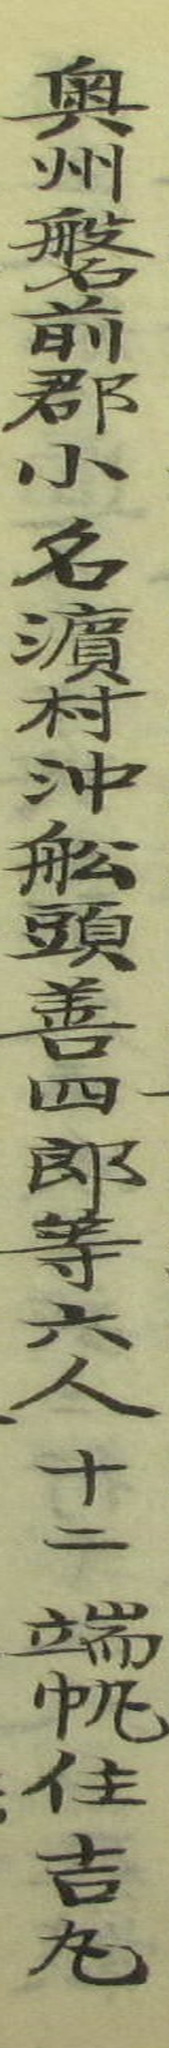奥州磐前郡小名濵村沖舩頭善四郎等六人十二端帆住吉丸
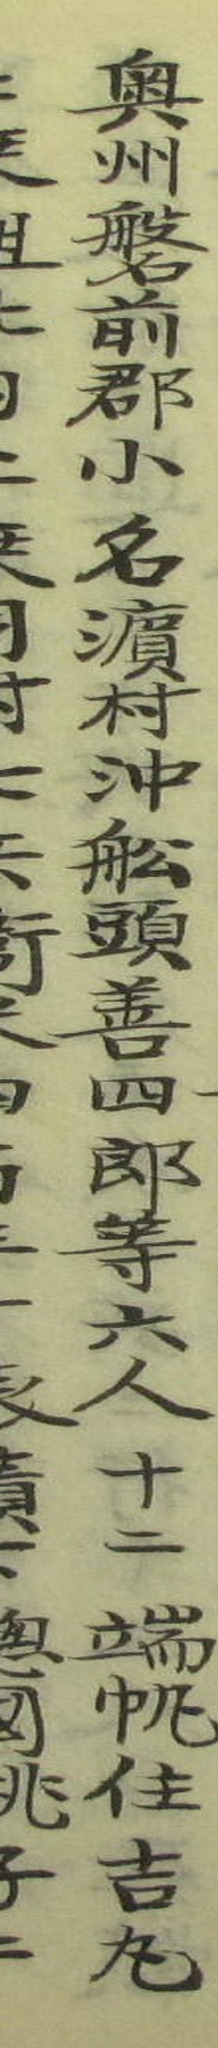奥州磐前郡小名濵村沖舩頭善四郎等六人十二端帆住吉丸
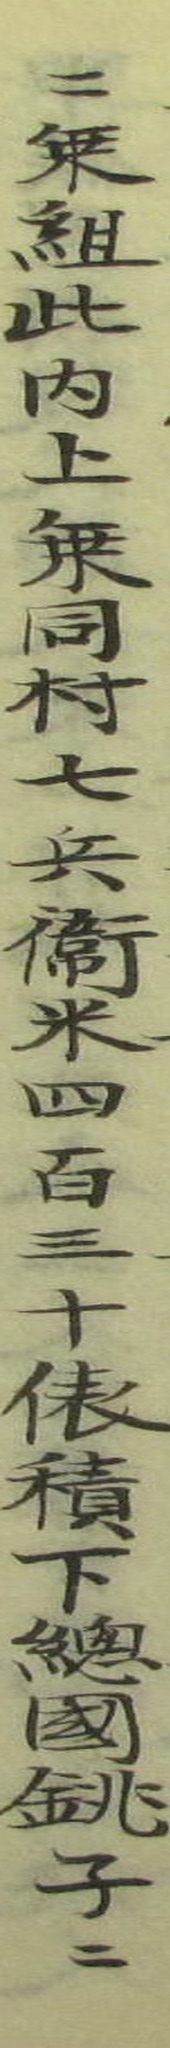ニ乗組此内上乗同村七兵衛米四百三十俵積下總國銚子ニ
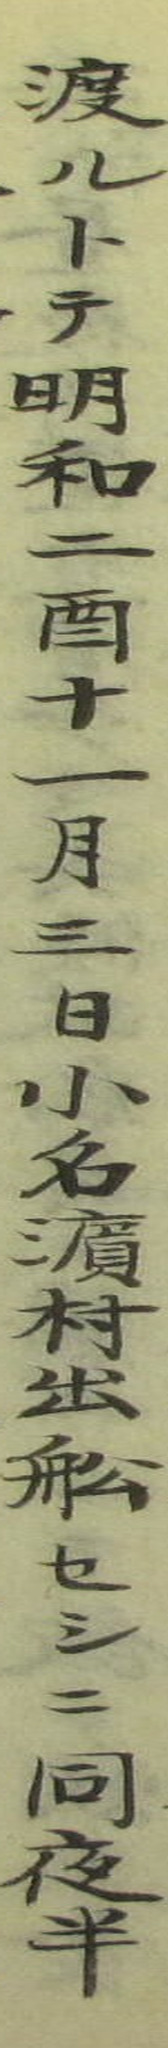渡ルトテ明和二酉十一月三日小名濵村出舩セシニ同夜半
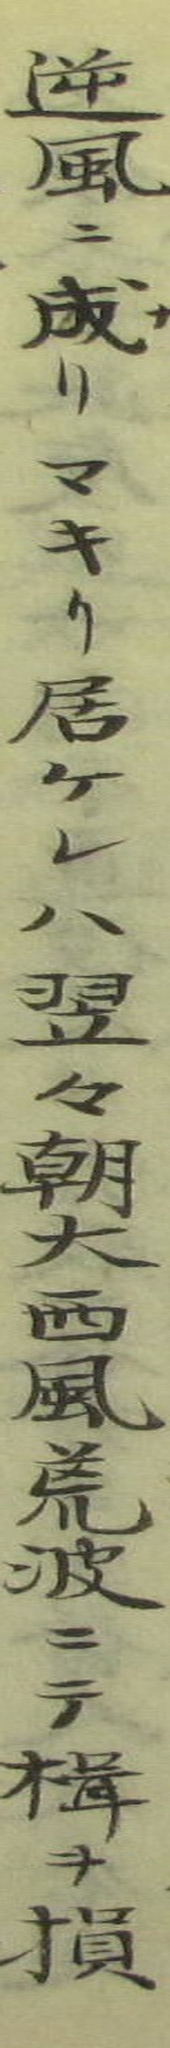逆風ニ成リマキリ居ケレハ翌々朝大西風荒波ニテ楫ヲ損
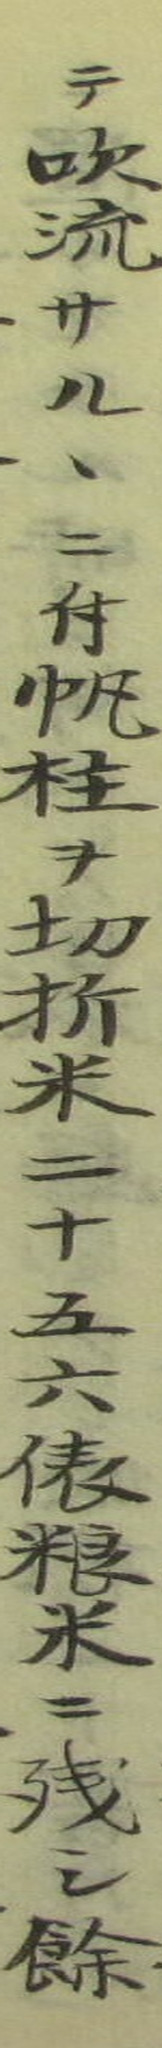テ吹流サルヽニ付帆柱ヲ切折米二十五六俵粮米ニ残シ餘
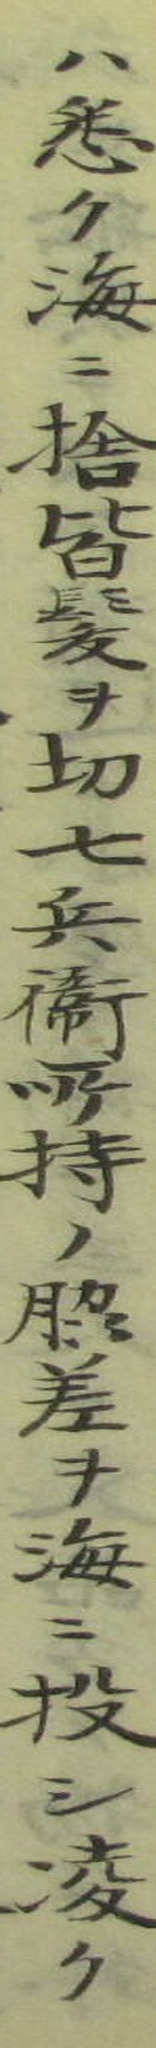ハ悉ク海ニ捨皆髪ヲ切七兵衛所持ノ脇差ヲ海ニ投シ凌ク
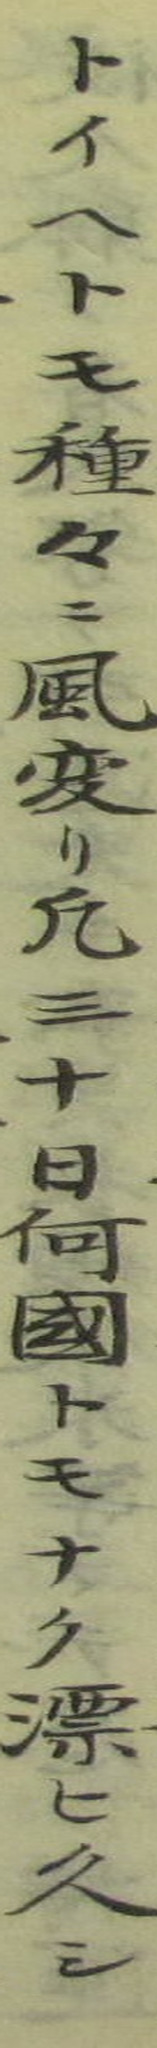トイヘトモ種々ニ風変リ凡三十日何國トモナク漂ヒ久シ
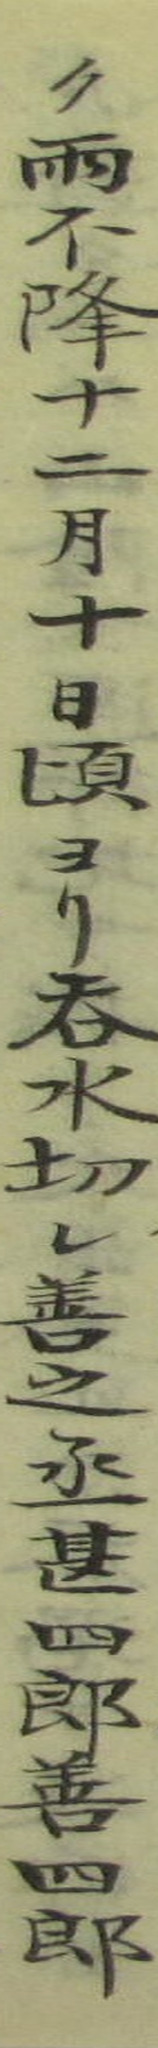ク雨不降十二月十日頃ヨリ呑水切レ善之丞甚四郎善四郎
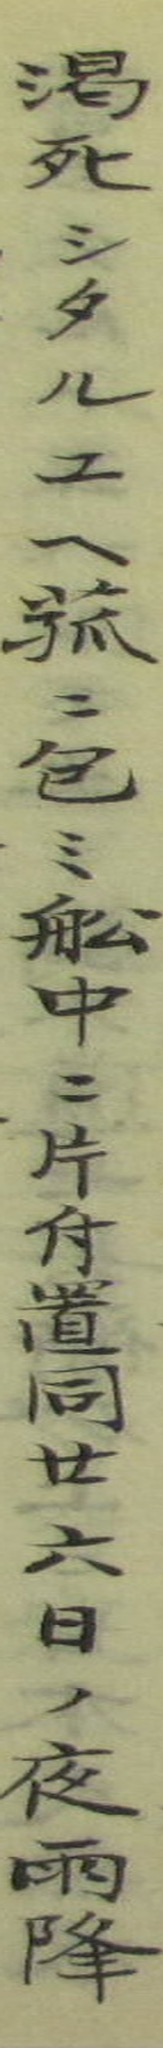渇死シタルユヘ菰ニ包ミ舩中ニ片付置同廿六日ノ夜雨降
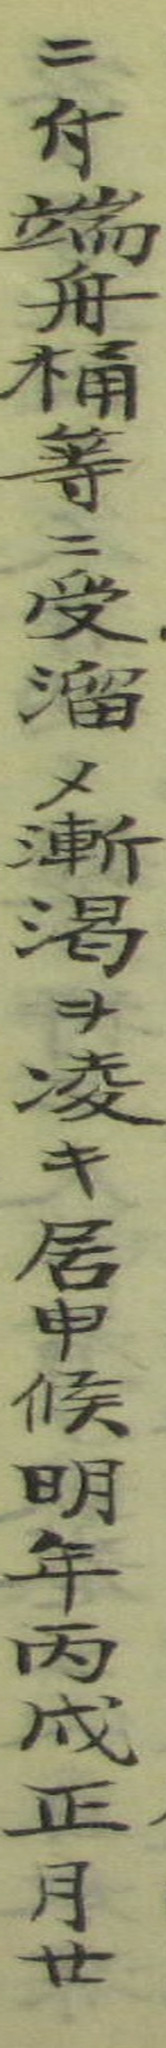ニ付端舟桶等ニ受溜メ漸渇ヲ凌キ居申候明年丙戌正月廿
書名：異国船漂着記 外二
